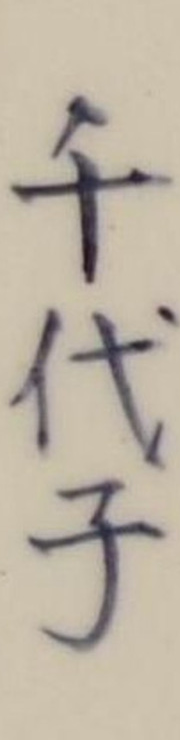千代子
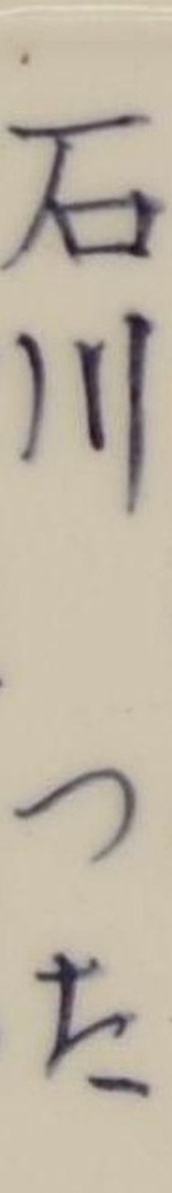石川つた
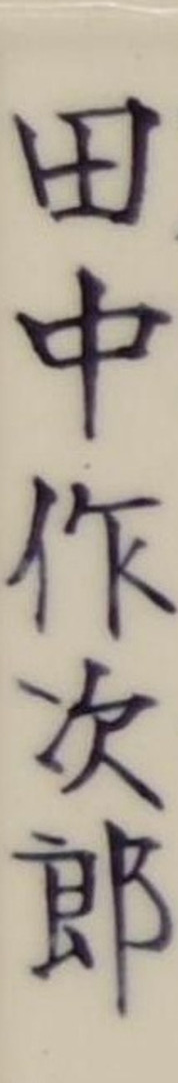田中作次郎

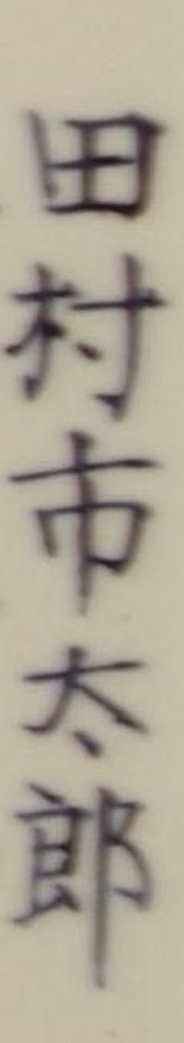田村市太郎
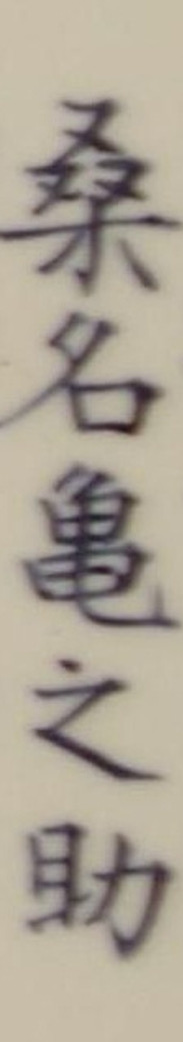桑名亀之助
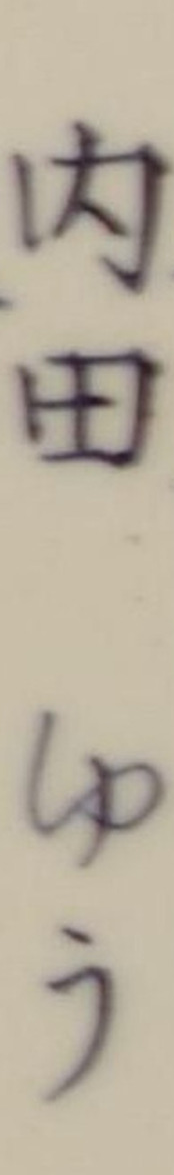内田ゆう
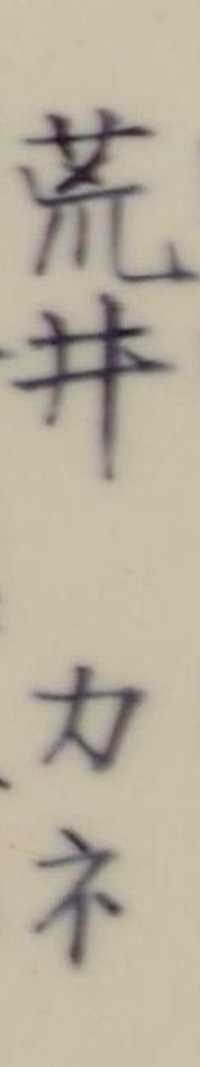荒井カネ
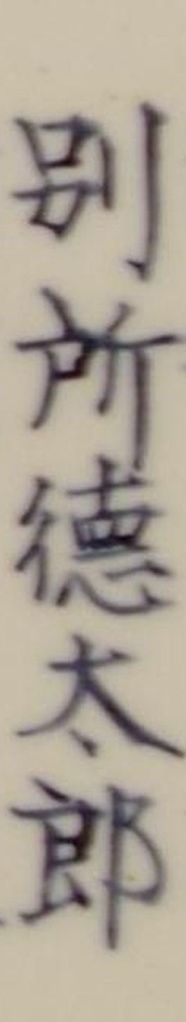別所徳太郎
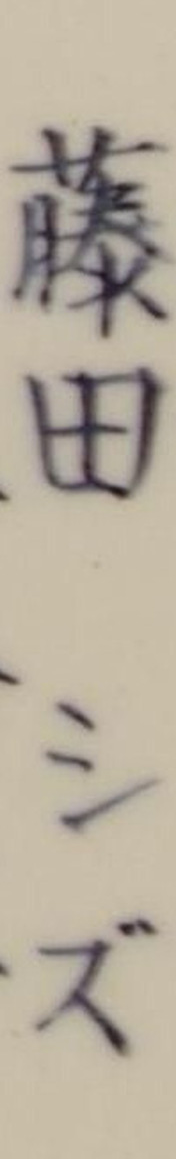藤田シズ
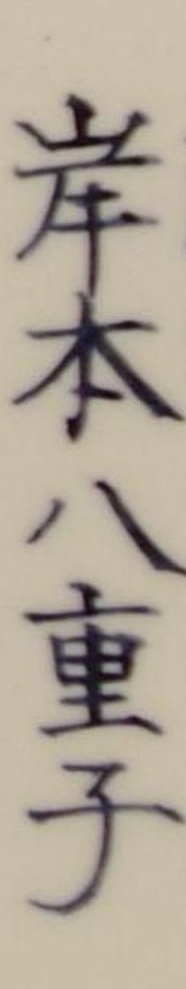岸本八重子
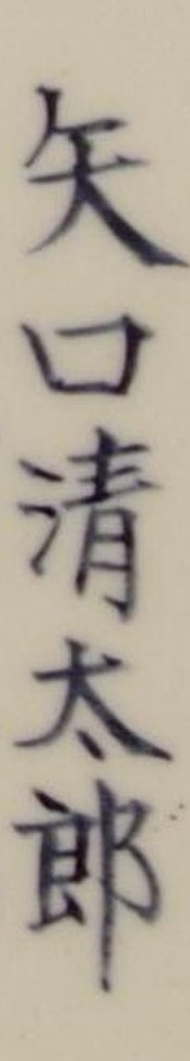矢口清太郎
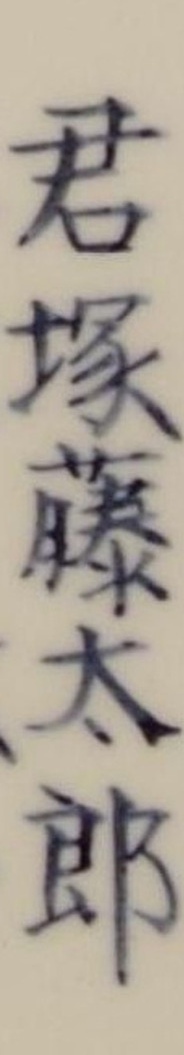君塚藤太郎
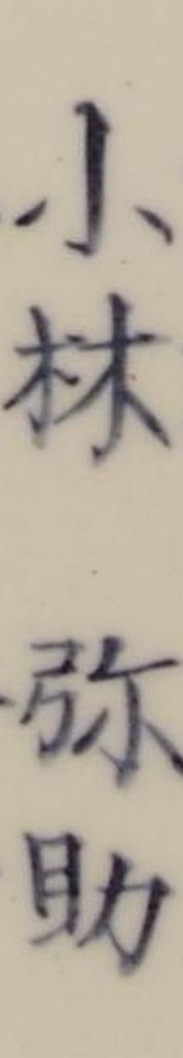小林弥助
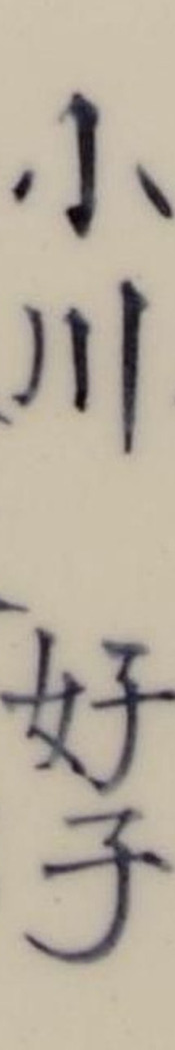小川好子
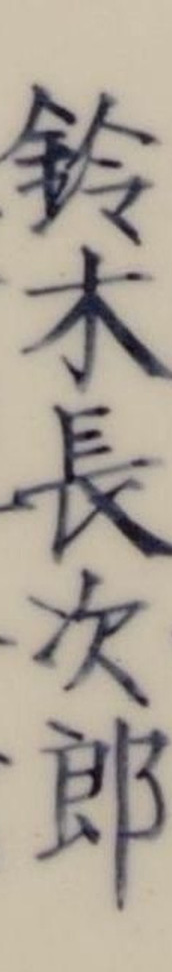鈴木長次郎
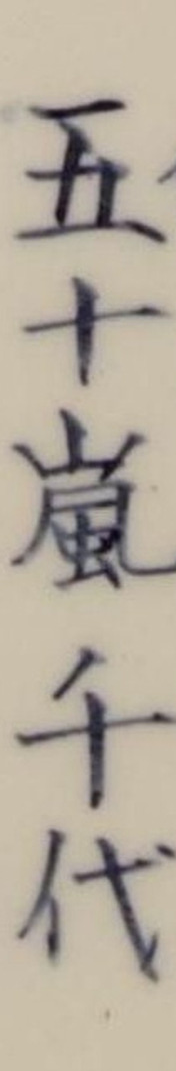五十嵐千代
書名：M~S
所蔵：高野山金剛峯寺
